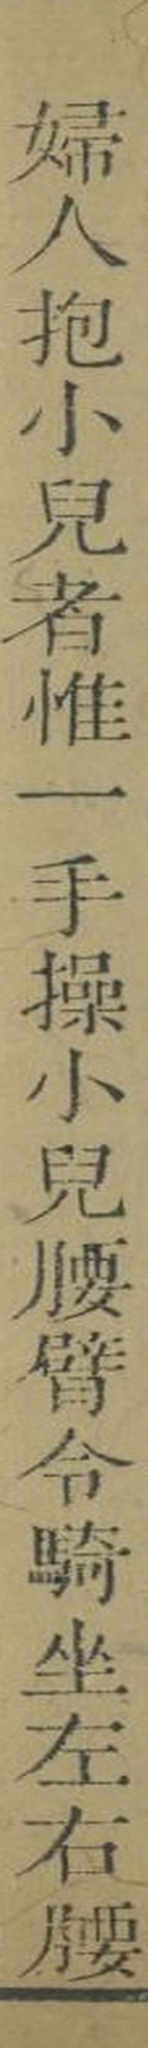婦人抱小児者惟一手操小児腰臂令騎坐左右腰

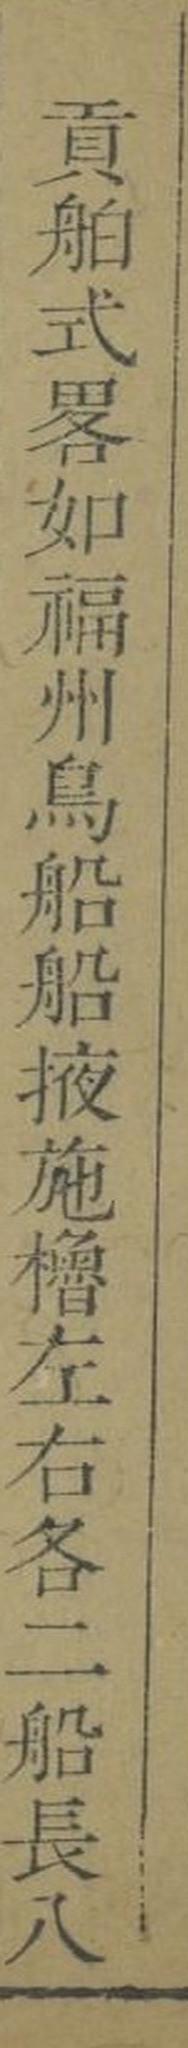貢舶式略如福州鳥船船掖施櫓左右各二船長八
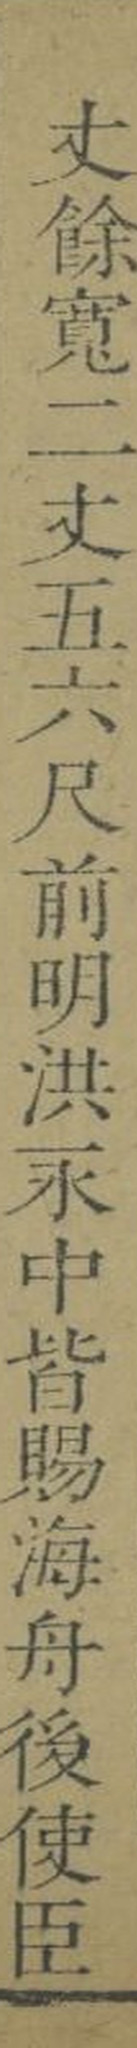丈余寛二丈五六尺前明洪永中皆賜海舟後使臣
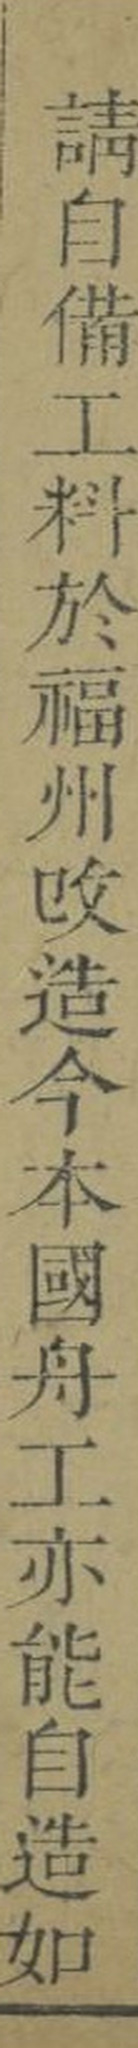請自備工料於福州改造今本国舟工亦能自造如
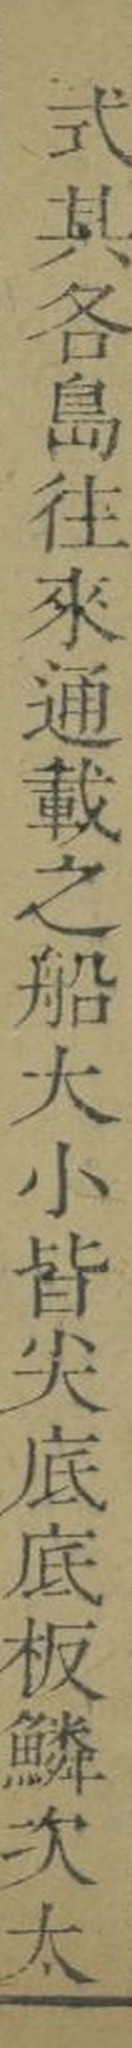式其各島往来通載之船大小皆尖底底板鱗次太
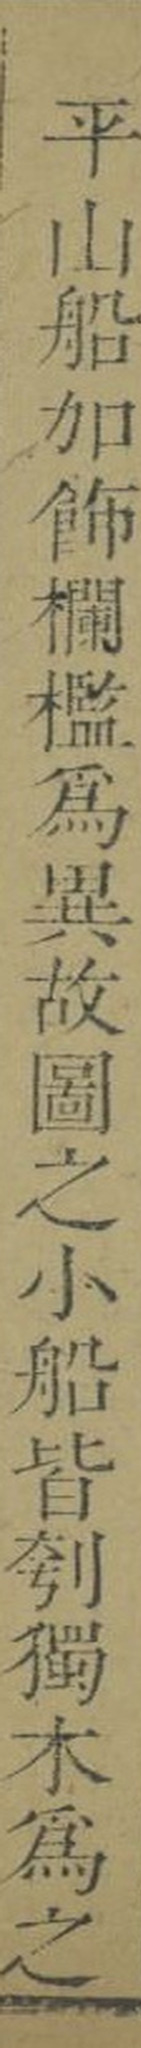平山船加飾欄檻為異故図之小船皆刳独木為之
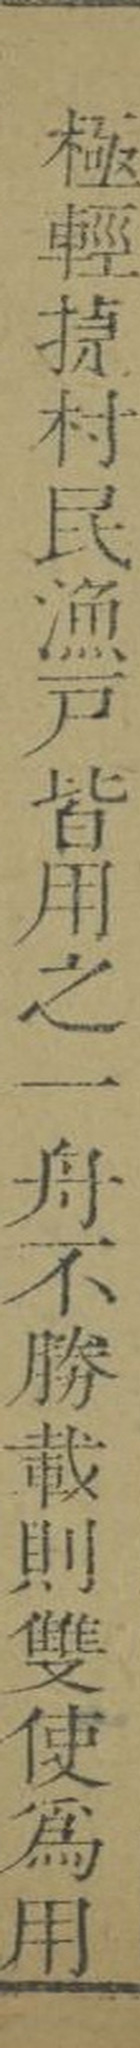極軽㨗村民漁戸皆用之一舟不勝載則双使為用

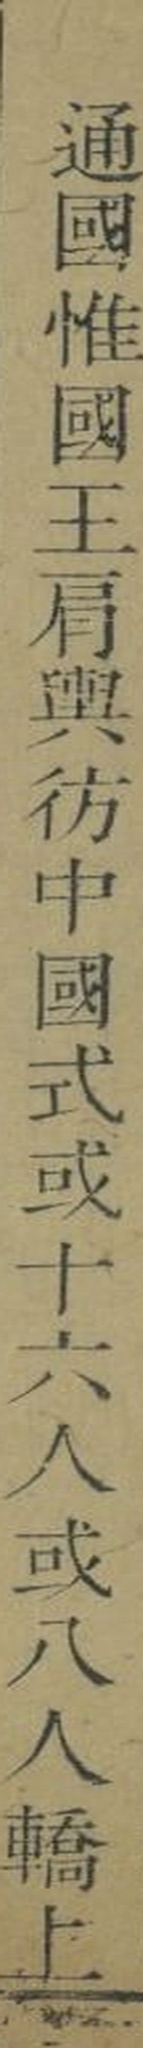通国惟国王肩輿彷中国式或十六人或八人轎上
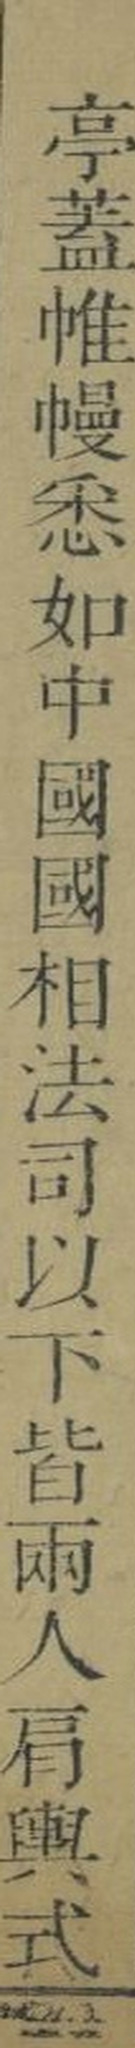亭蓋帷幔悉如中国国相法司以下皆両人肩輿式
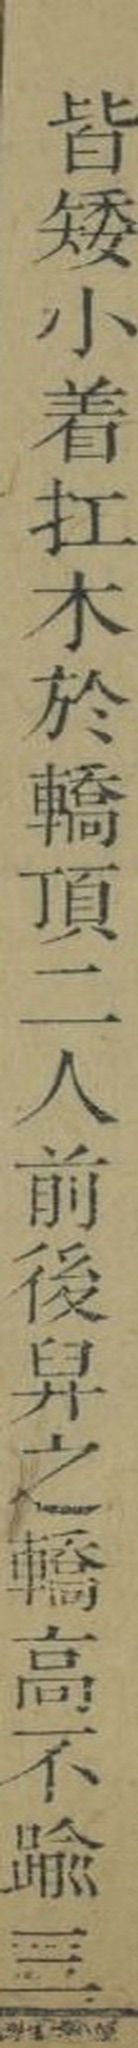皆矮小着扛木於轎頂二人前後舁之轎高不踰三
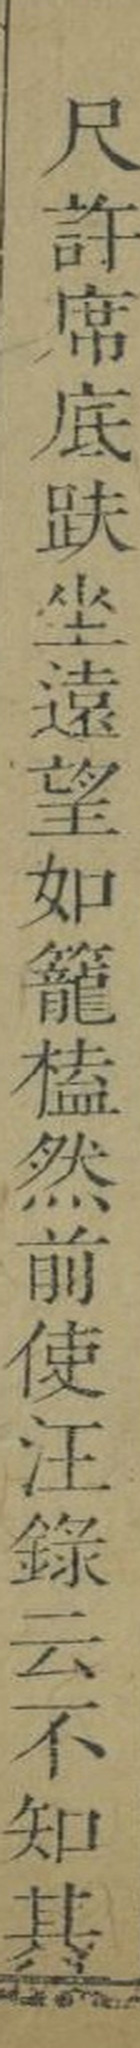尺許席底趺坐遠望如篭榼然前使汪録云不知其
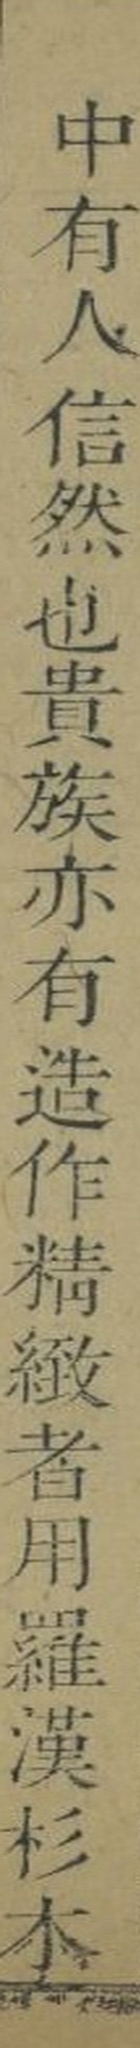中有人信然也貴族亦有造作精緻者用羅漢杉木
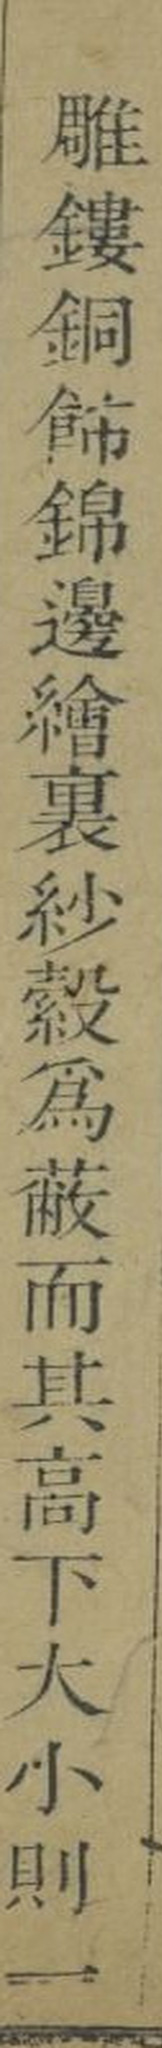雕鏤銅飾錦辺絵裏紗縠為蔽而其高下大小則一
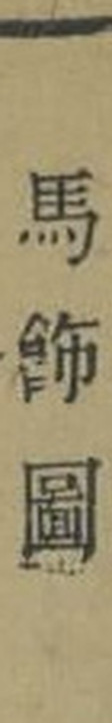馬飾図

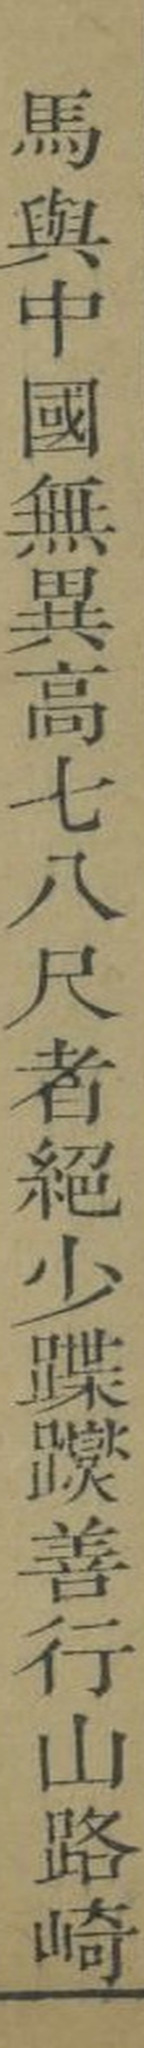馬与中国無異高七八尺者絶少蹀躞善行山路崎
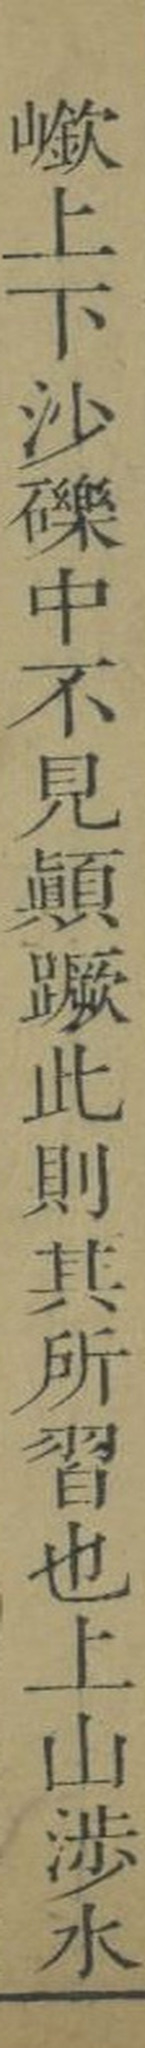嶔上下沙礫中不見顚蹶此則其所習也上山渉水
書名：中山伝信録 巻六
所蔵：University of the Ryukyus Library
